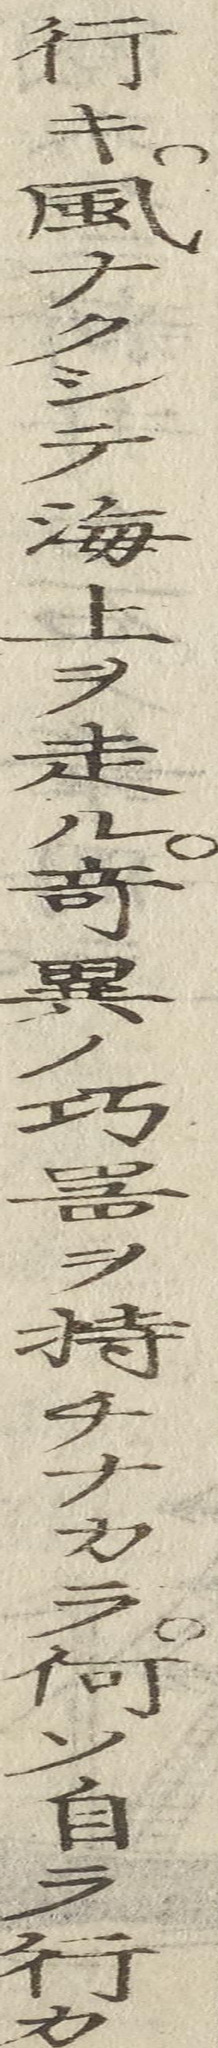行キ。風ナクシテ海上ヲ走ル。奇異ノ巧器ヲ持チカラ。何ソ自ラ行カ
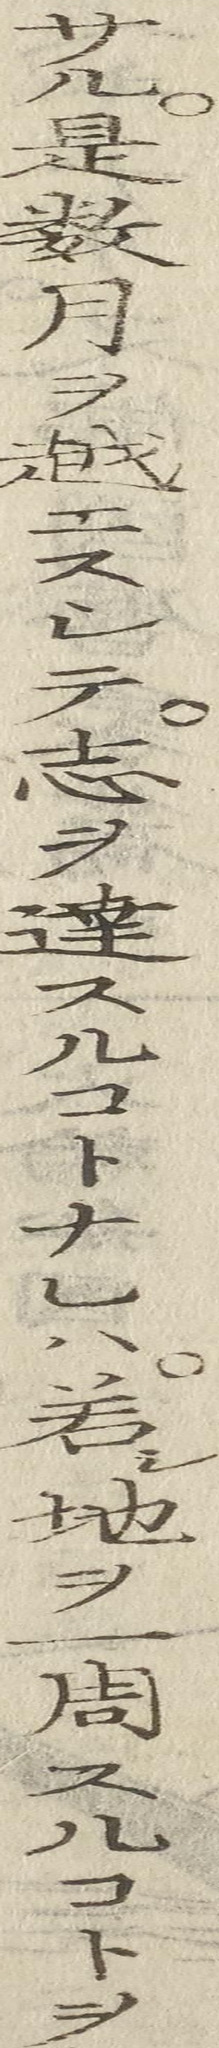サル。是数月ヲ越エスシテ。志ヲ達スルコトナレハ。若地球ヲ一周スルコトヲ
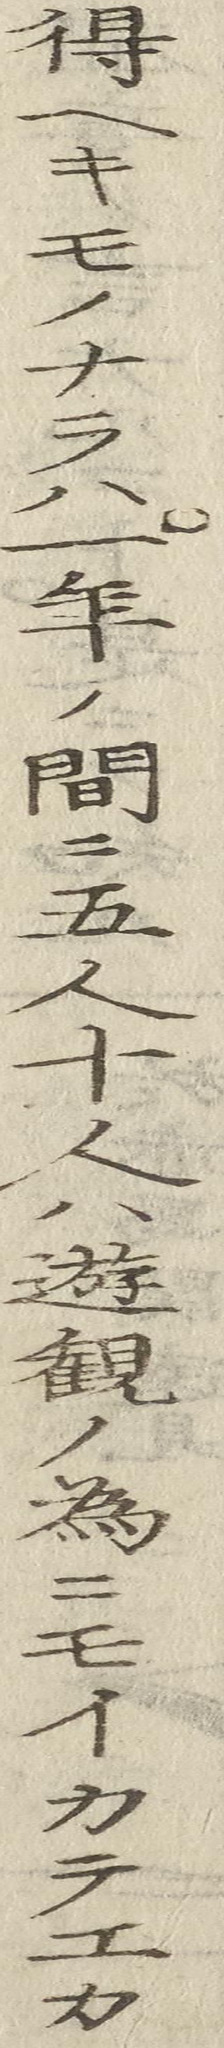得ヘキモノナラハ。一年ノ間ニ五人十人ハ遊観ノ為ニモイカテエカ
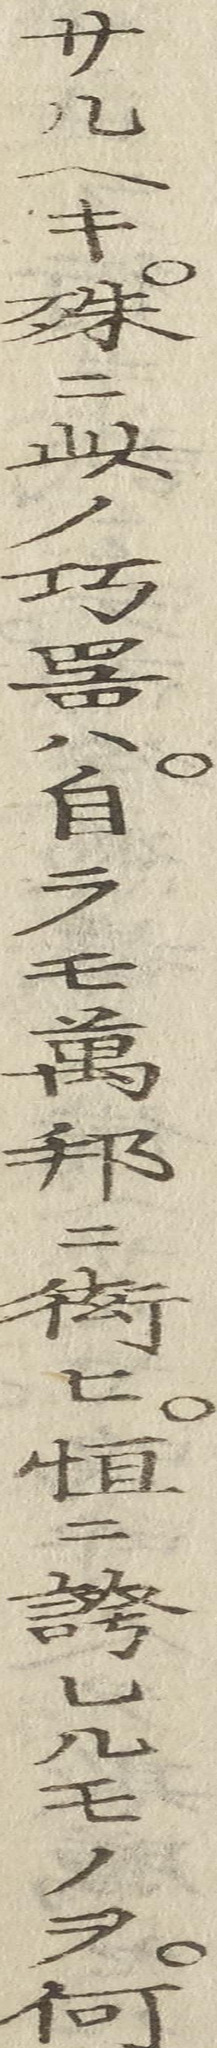サルヘキ。殊ニ此ノ巧器ハ。自ラモ万邦ニ衒セ。恒ニ誇レルモノヲ。何

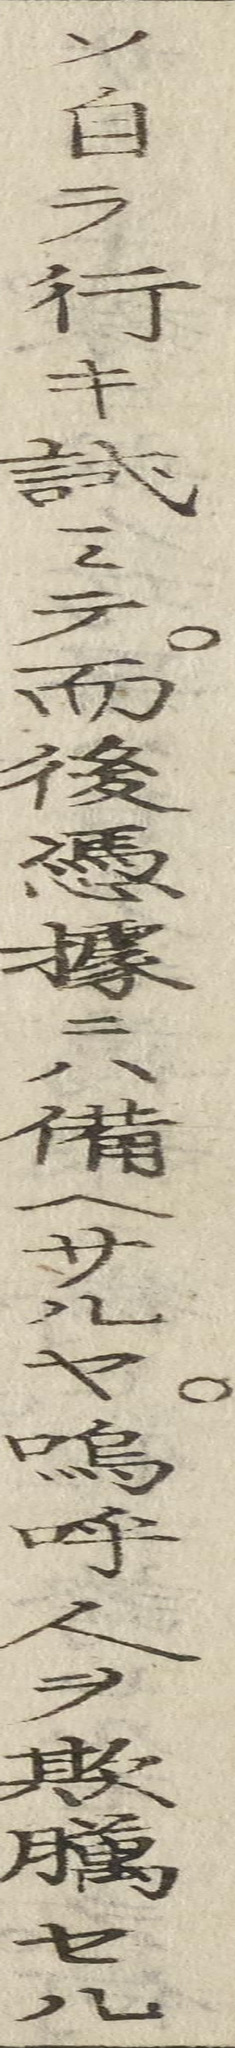ソ自ラ行キ試ミテ。而後憑拠ニハ備ヘサルヤ。嗚呼人ヲ欺瞞セル
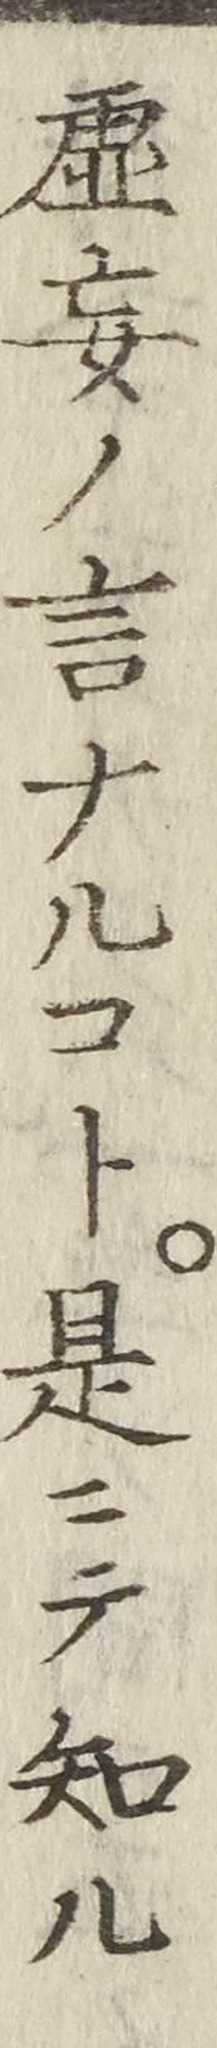虚妄ノ言ナルコト。是ニテ知ル
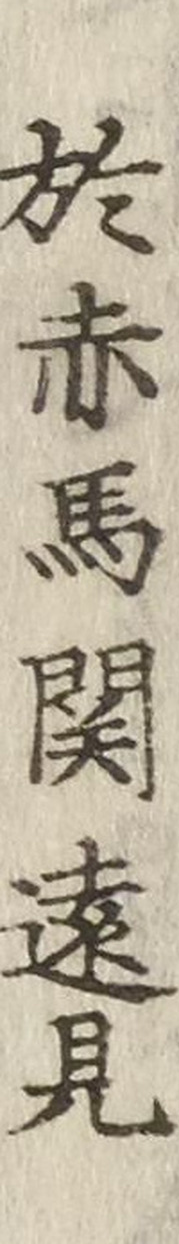於赤馬関遠見
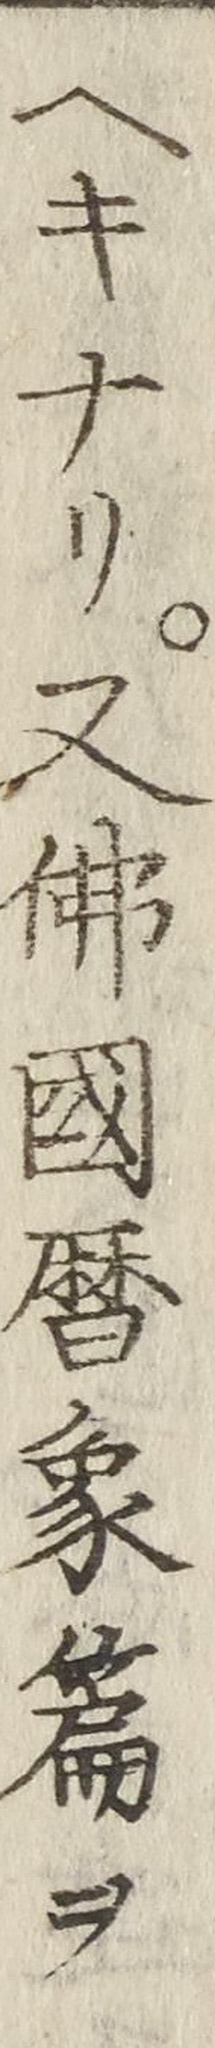ヘキナリ。又仏国暦象篇ヲ
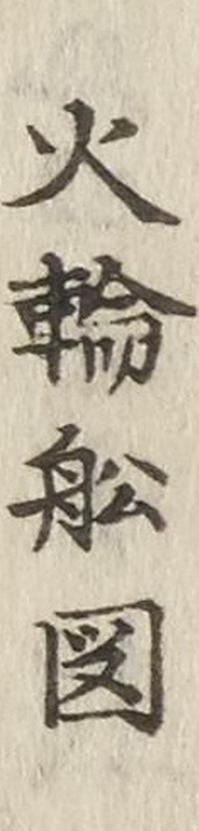火輪舩図
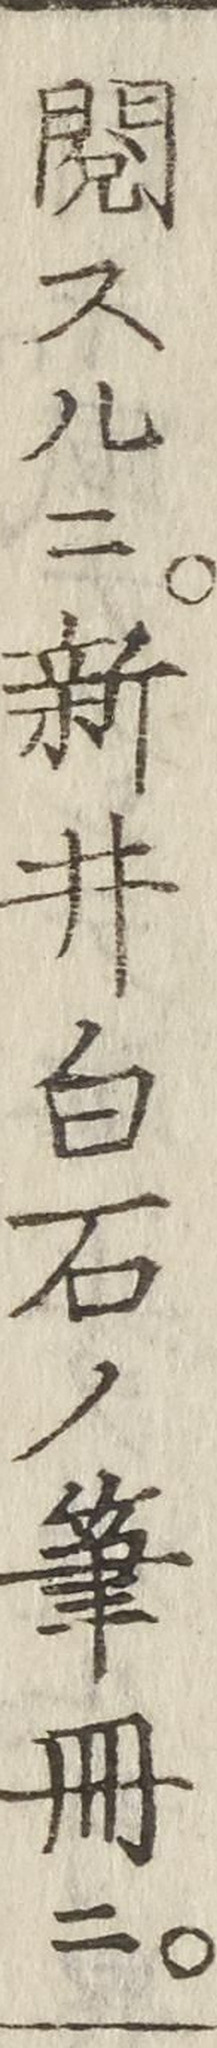閲スルニ。新井白石ノ筆冊ニ。
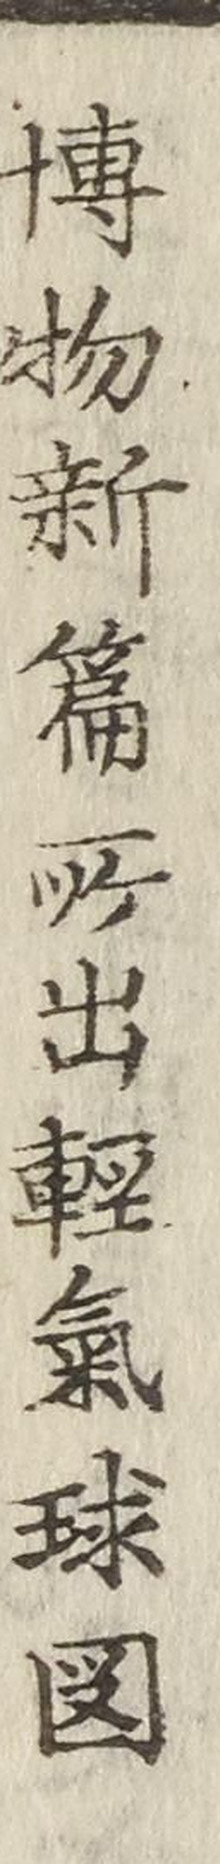博物新篇所出軽気球図
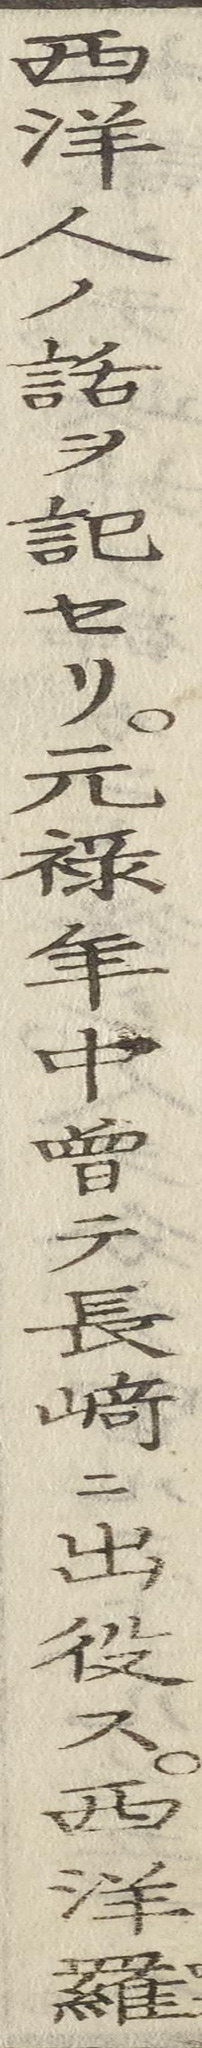西洋人ノ話ヲ記セリ。元禄年中曾テ長崎ニ出没ス。西洋羅
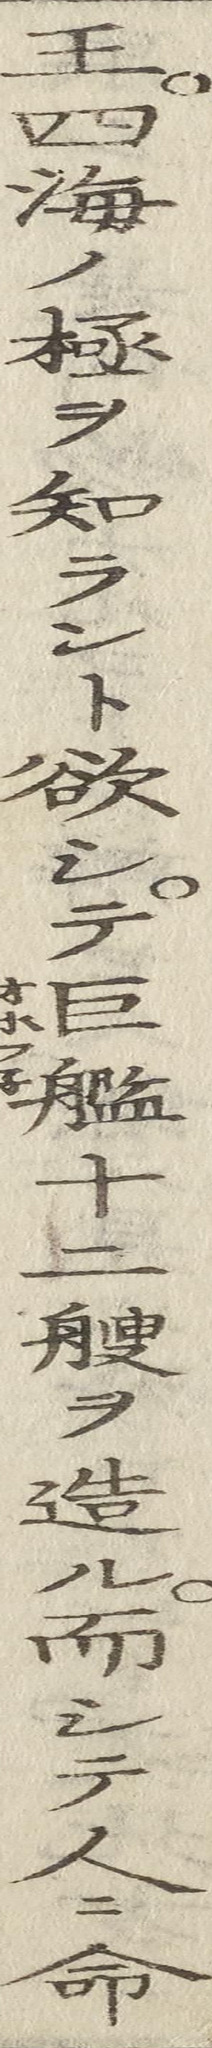王。四海ノ極ヲ知ラント欲シ。テ巨艦十二艘ヲ造ル。而シテ人ニ命
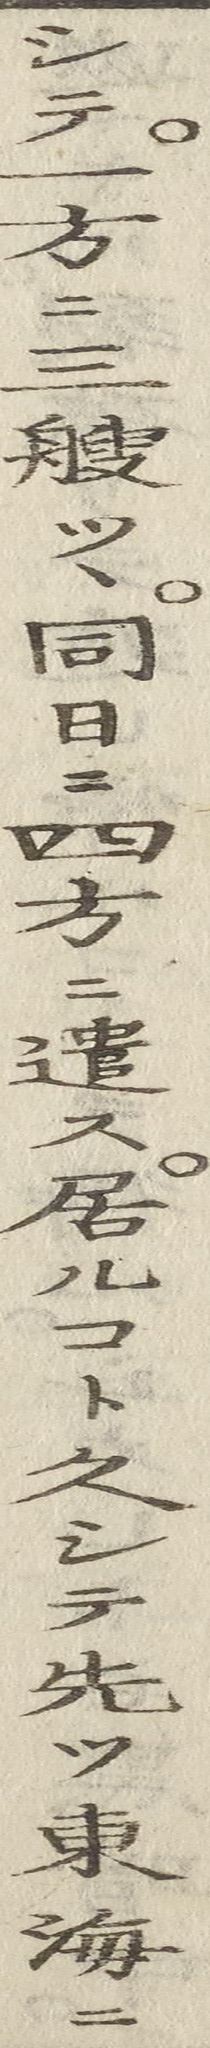シテ。一方ニ三艘ツヽ。同日ニ四方ニ遣ス。居ルコト久シテ先ツ東海ニ
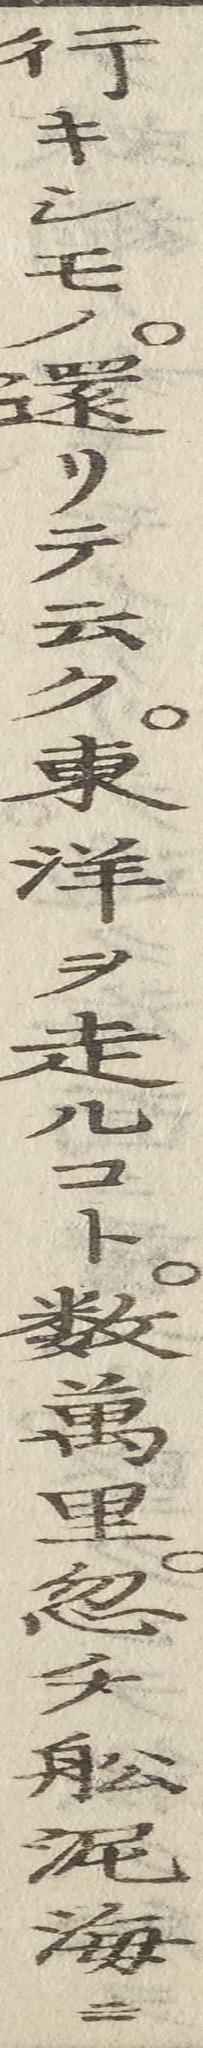行キシモノ。還リテ云ク。東洋ヲ走ルコト。数万里。忽チ舩泥海ニ
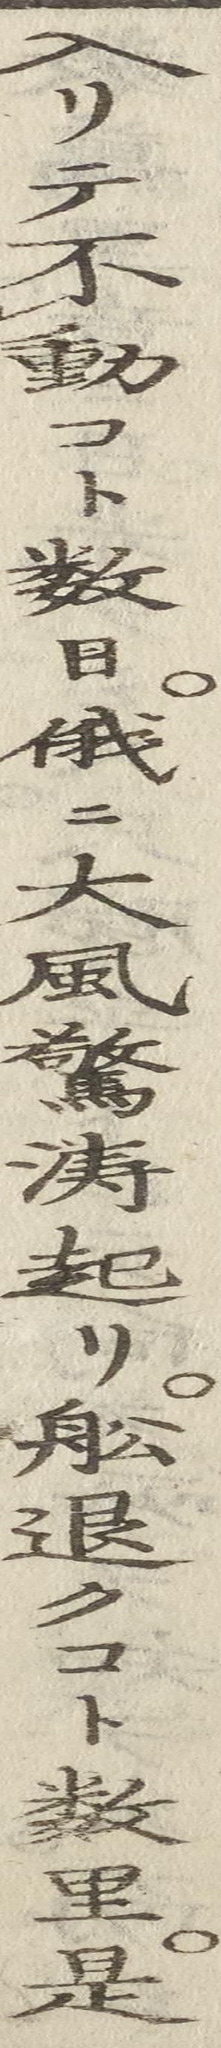入リテ不動コト数日。俄ニ大風驚涛起リ。舩退クコト数里。是
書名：護法新論　中
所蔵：東京大学地震研究所図書室 Earthquake Research Institute Library, The University of Tokyo, JAPAN
